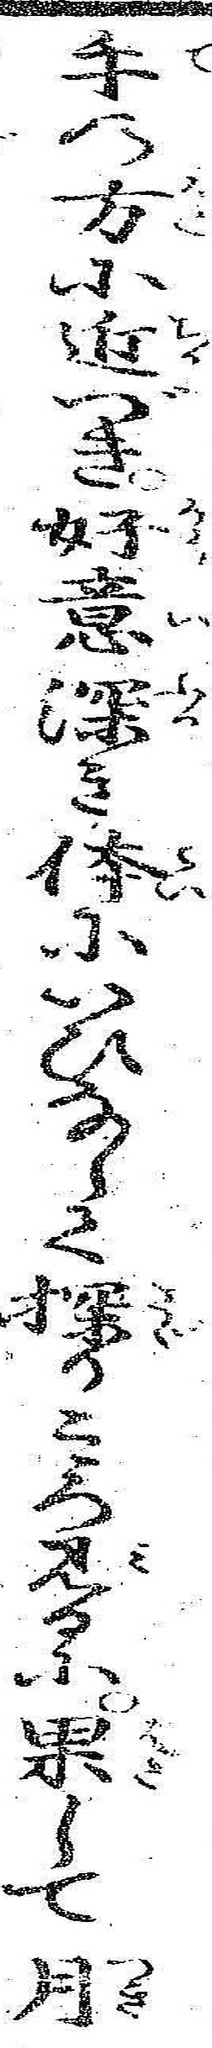手の方に近づき。好意深き体にいひなして探りこゝろ見るに。果して月
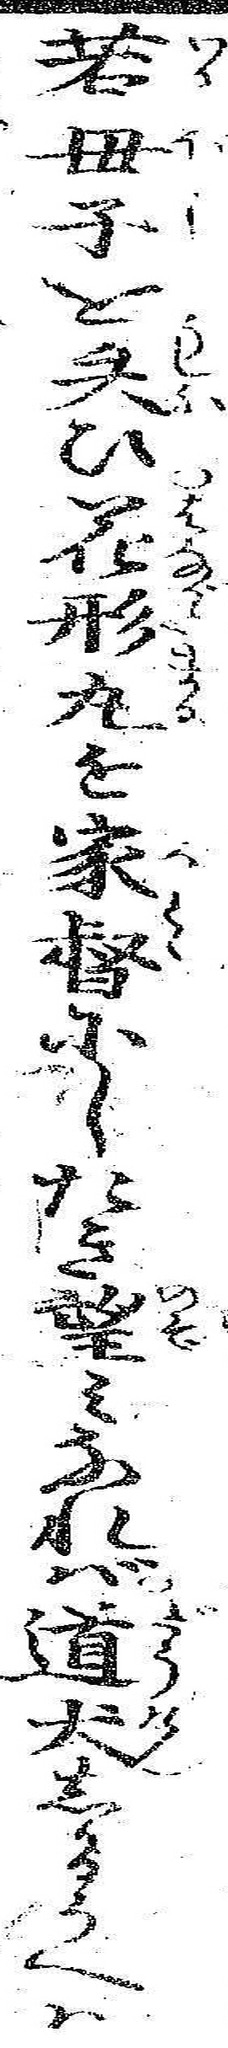若母子を矢ひ。花形丸を家督にしたき望みなれば。道犬しかるうへは
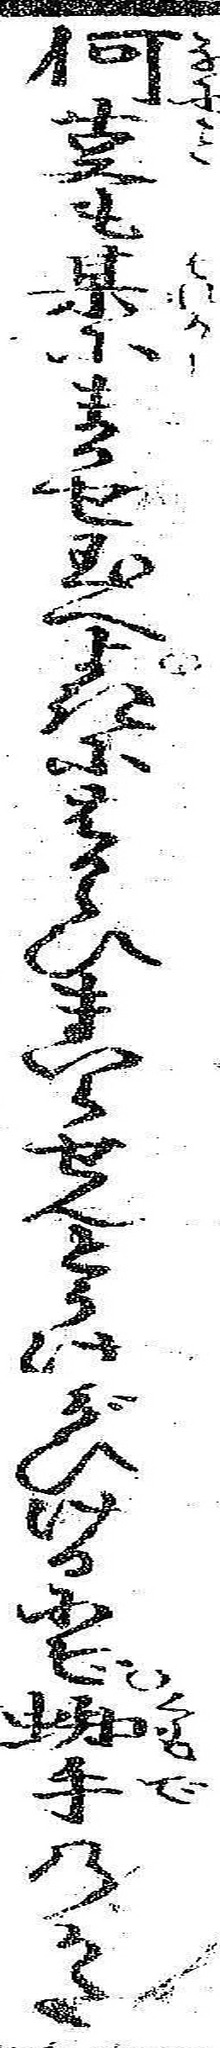何事も某にまかせ玉へ。よきにはからひまいらせんとうけがひけるにぞ。蜘手のかた
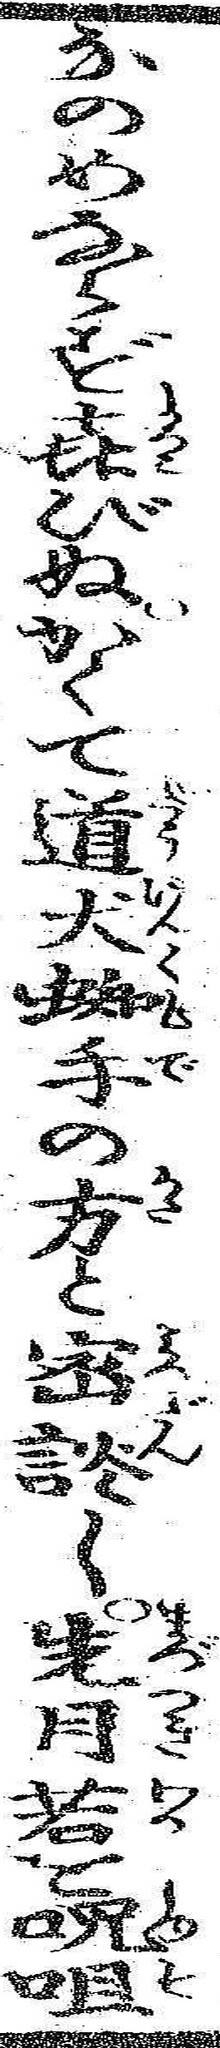なのめならず喜びぬ。かくて道犬蜘手の方と密談し。先月若を呪咀
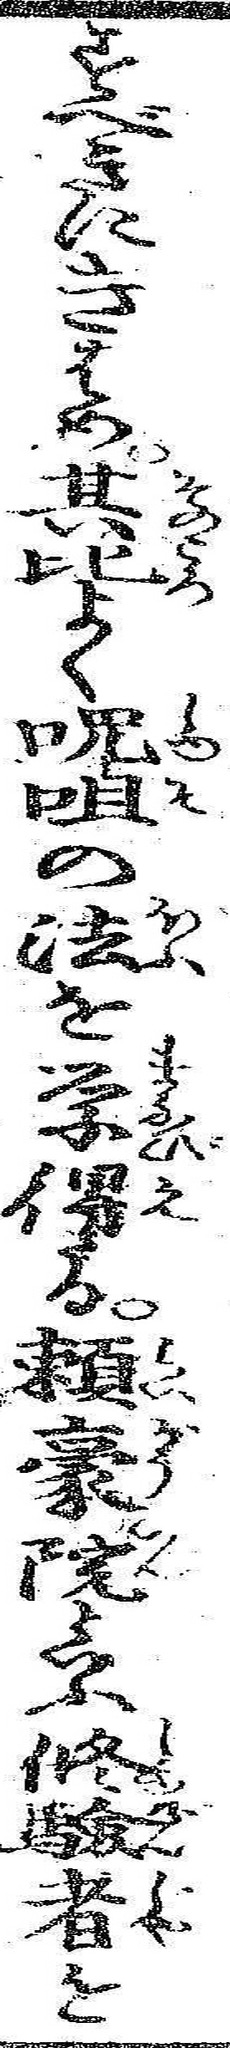すべきにきはめ。其比よく呪咀の法を学得たる。頼豪院といふ修験者を
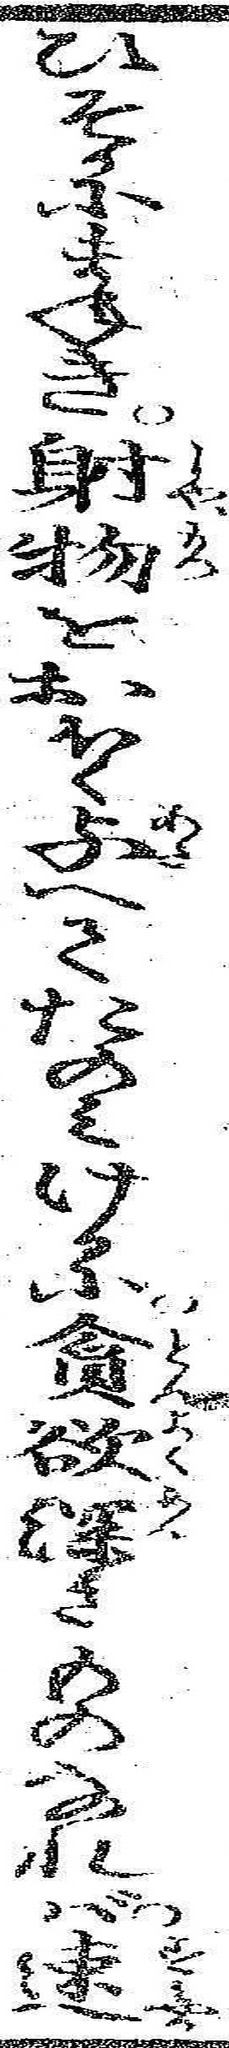ひそかにまねき。射物をおほく与へてたのみけるに。貪欲深きものなれば。速
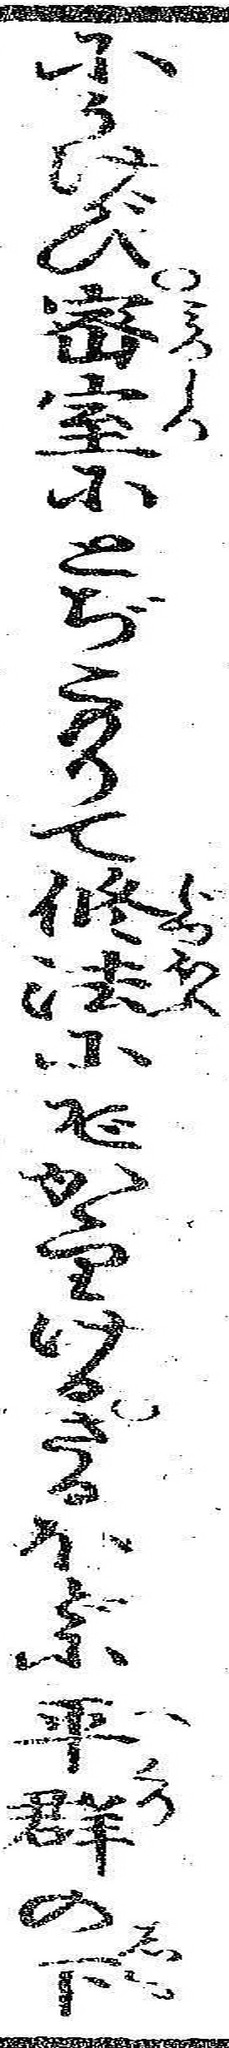にうけがひ。密室にとぢこもりて修法にぞかゝりける。さるほどに平群の下
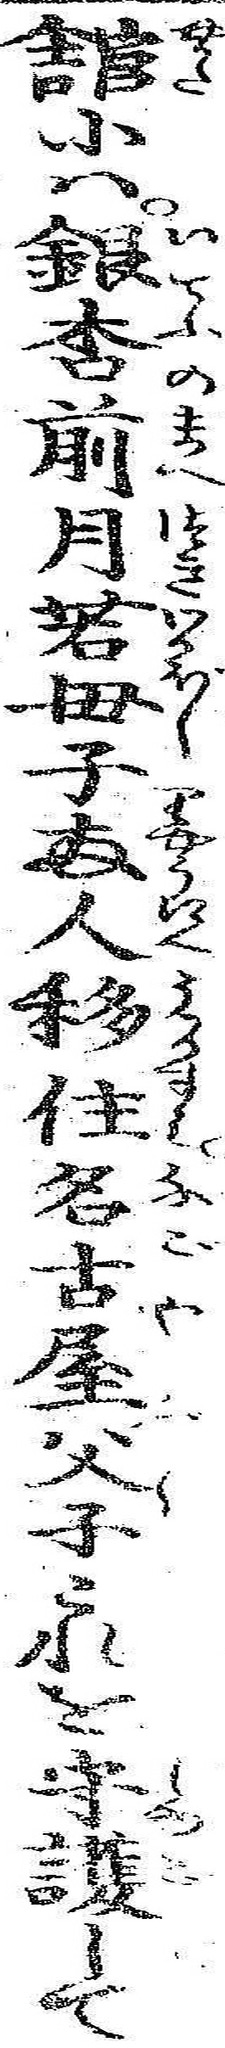館には。銀杏前月若母子両人移住。名古屋父子これを守護して
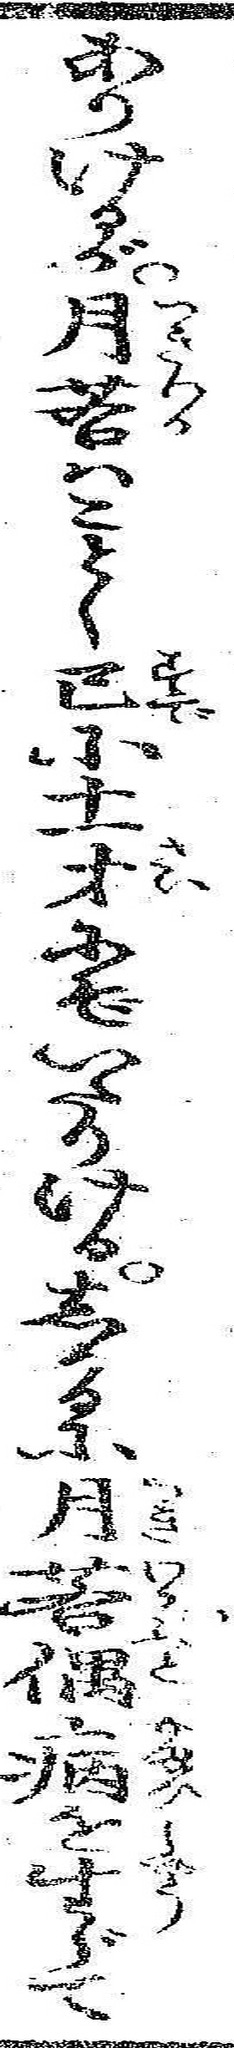ありけるが。月若はことし已に十一才にぞいたりける。しかるに月若偶病を生じて
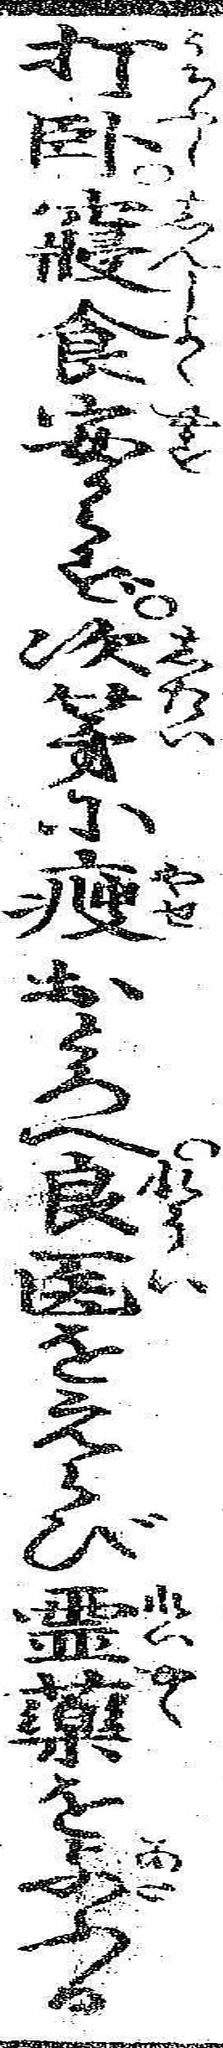打臥。寝食安からず。次第に痩おとろへ。良医をえらび霊薬を与ふる
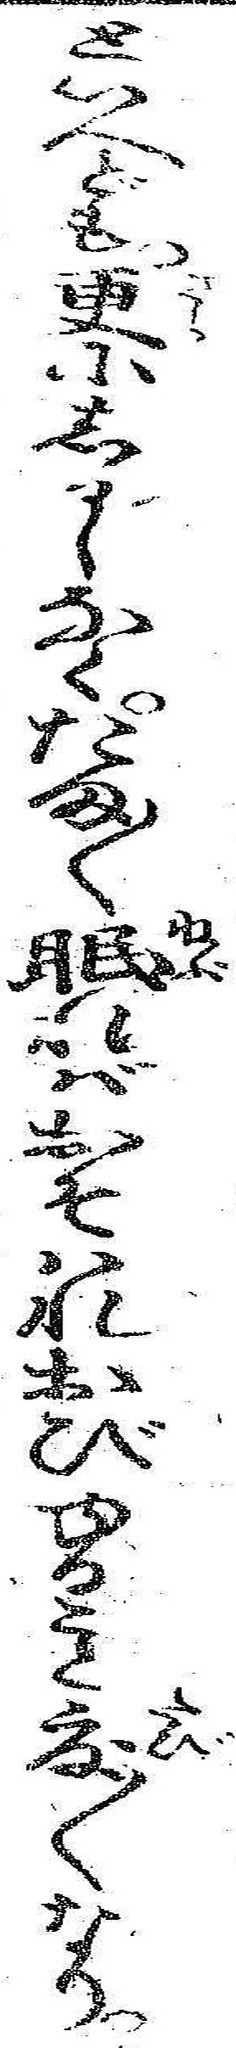といへども。更にしるしなく。たま〳〵眠ればおそはれおびゆること度々なり。
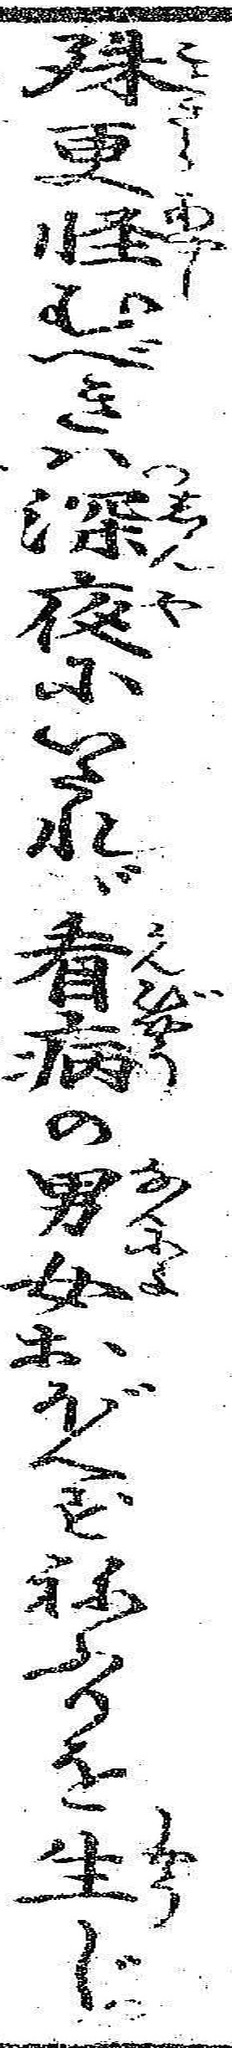殊更怪むべきは。深夜にいたれば看病の男女おぼへずねふりを生じ。
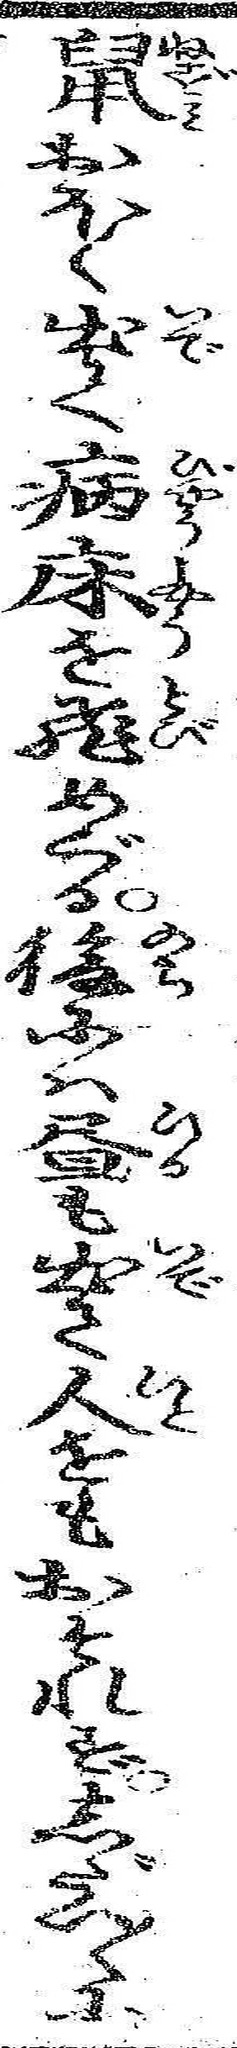鼠おほく出て病床を飛めぐる。後には昼も出て人をもおそれず。しだい〳〵に
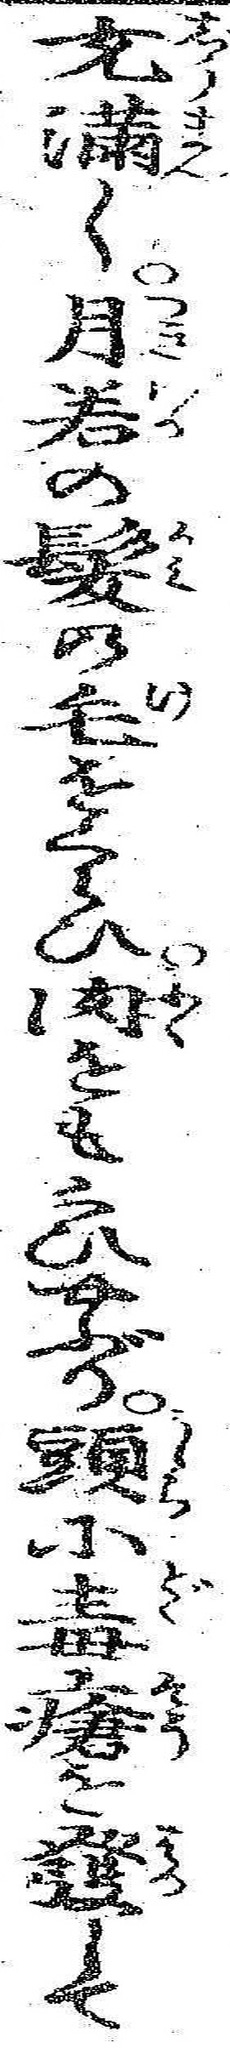充満し。月若の髪の毛をくらひ。肉をもくひやぶり。頭に毒瘡を発して

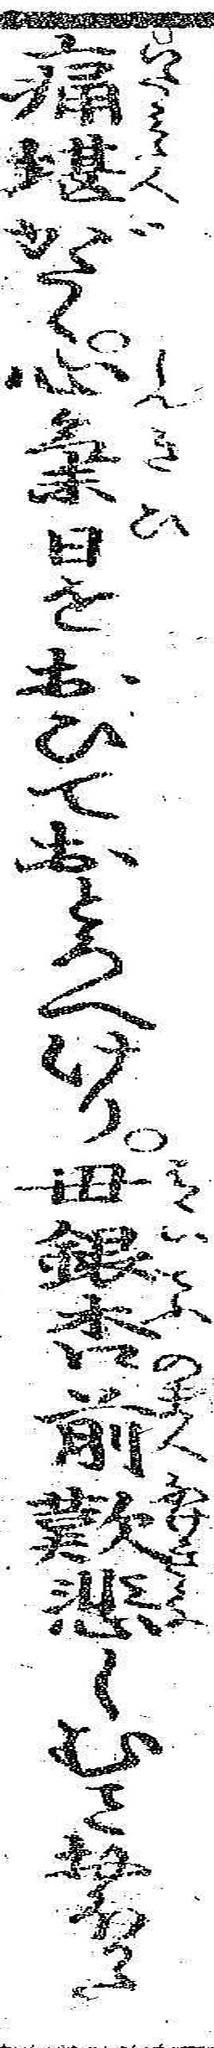痛堪がたく。心気日をおひておとろへけり。母銀杏前歎悲しむことおほかた
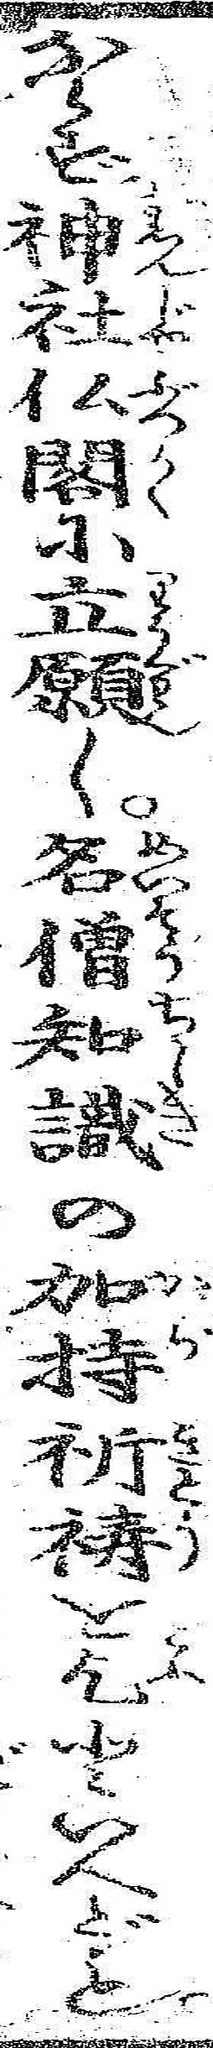ならず。神社仏閣に立願し。名僧知識の加持祈祷を乞といへども。
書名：昔話稲妻表紙
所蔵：国文学研究資料館
